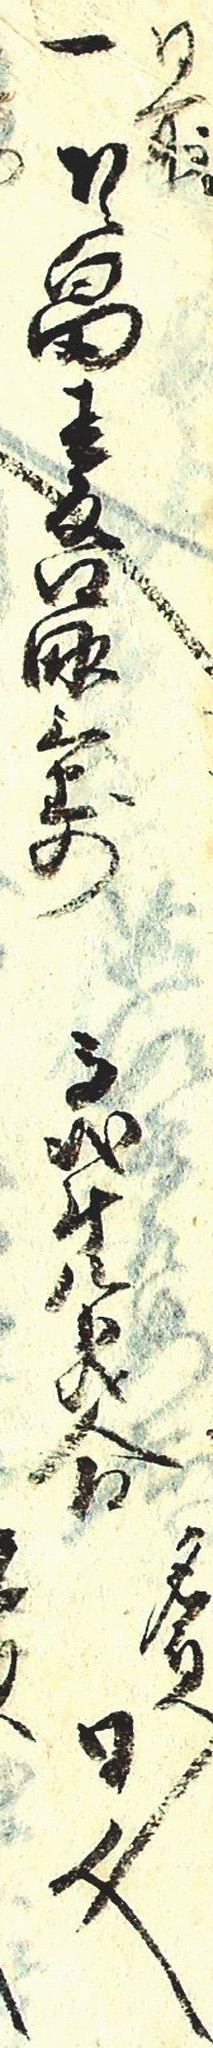一下々畠壱反四畝三歩高弐斗八升弐合同人
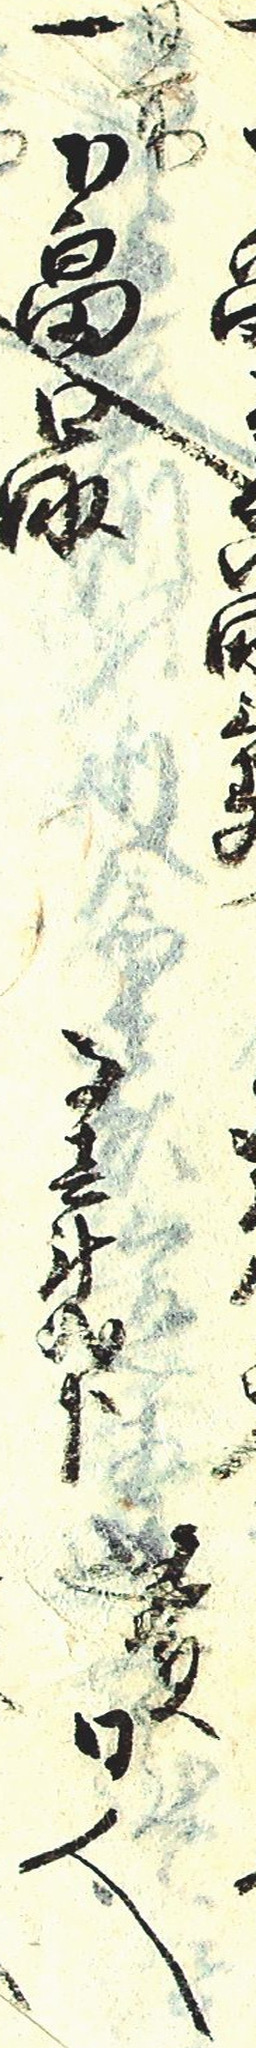一下畠四畝高壱斗弐升同人
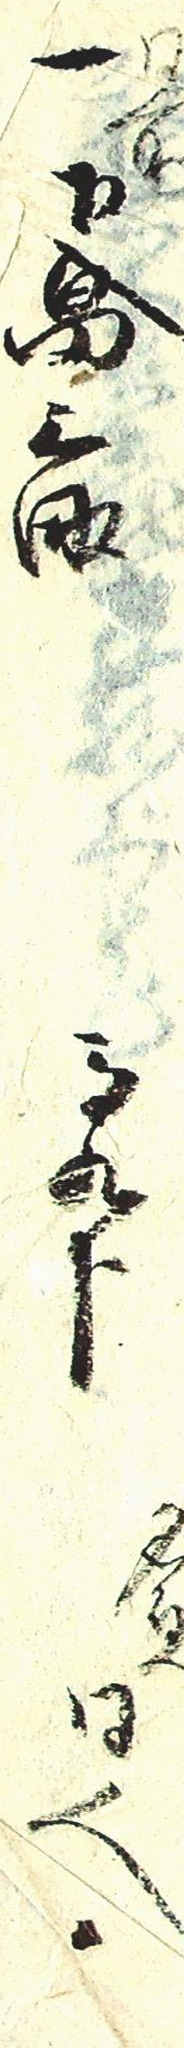一下畠三畝高九斗同人

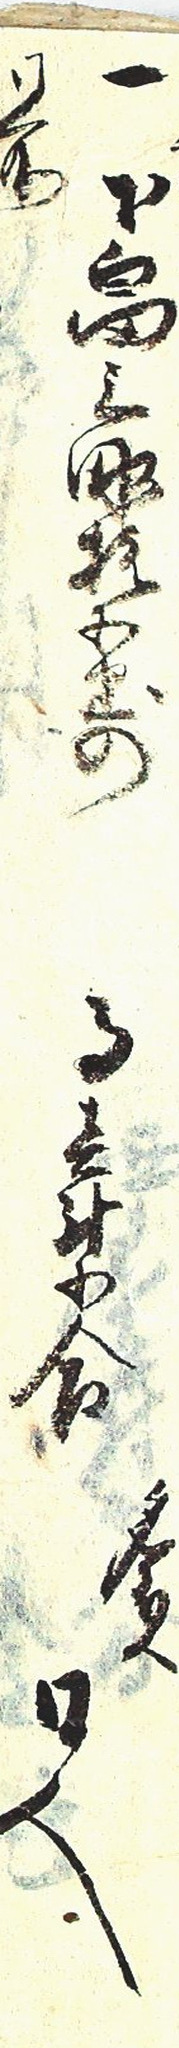一下畠三畝拾五歩高壱斗五合同人
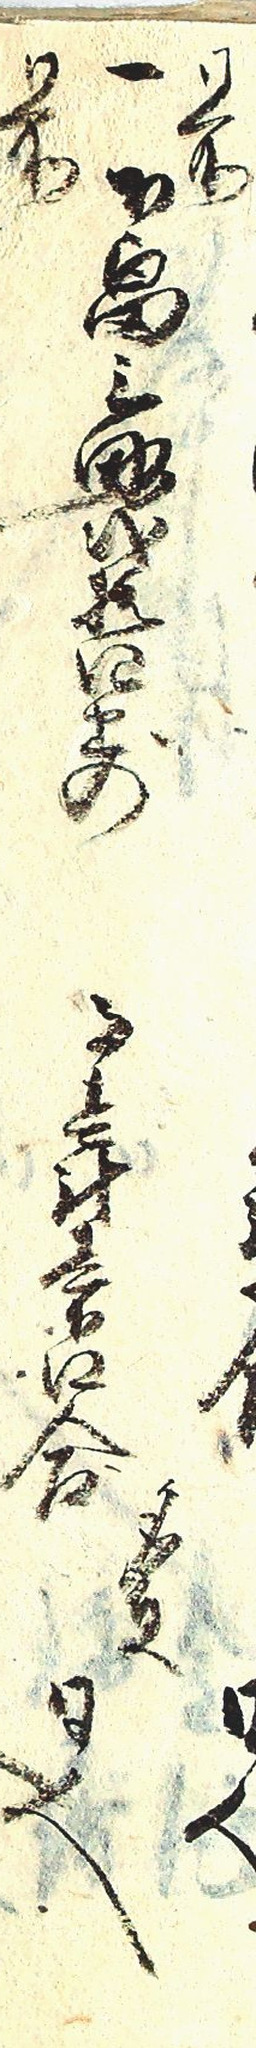一下畠三畝弐拾四歩高壱斗壱升四合同人
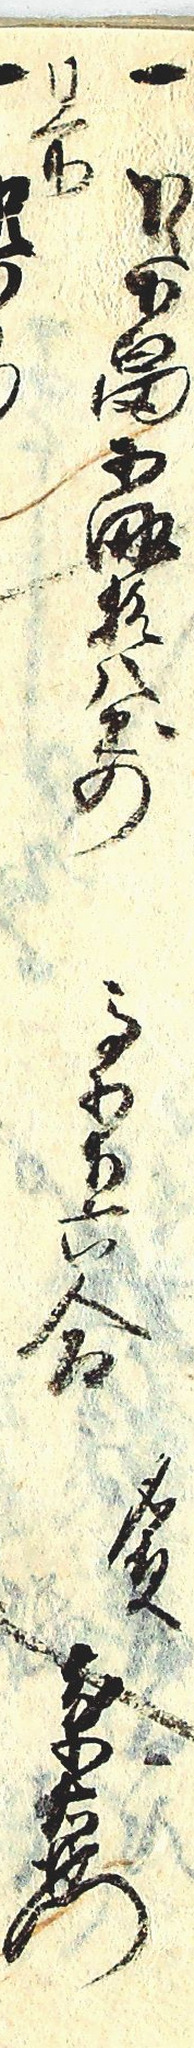一下々下畠五畝拾八歩高五升六合分五右衛門
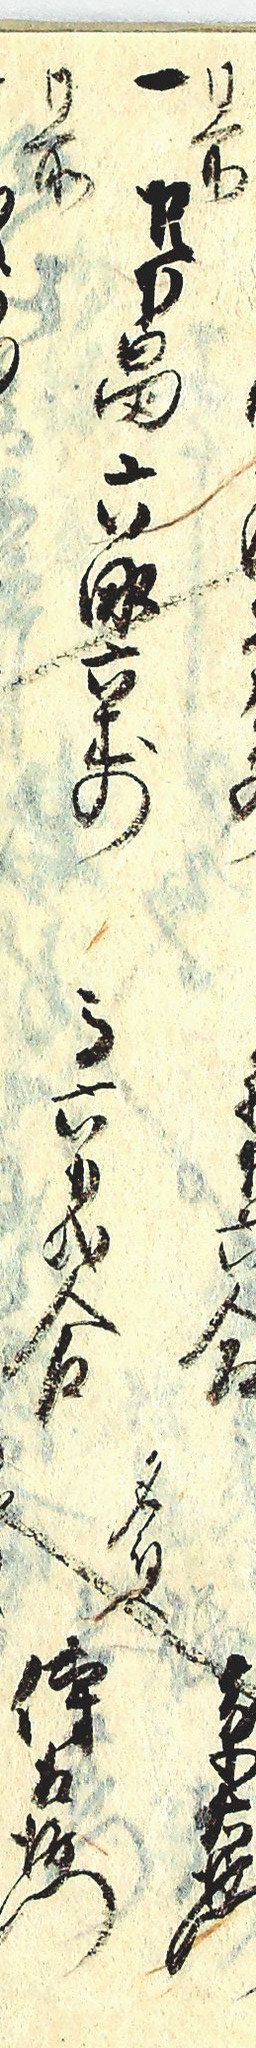一下々下畠六畝六歩高六升弐合伝左衛門
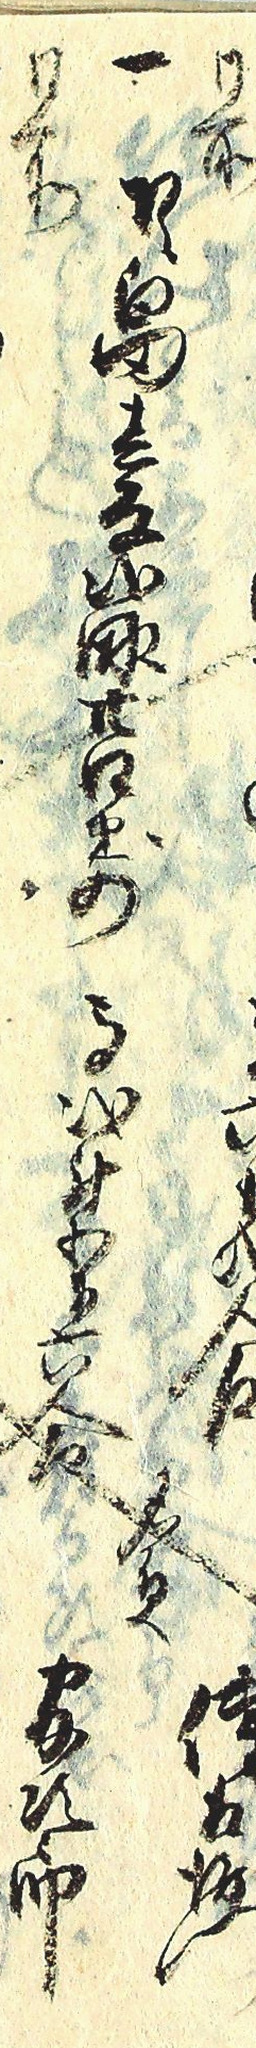一下々畠壱反弐畝廿四歩高弐斗五升六合官次郎
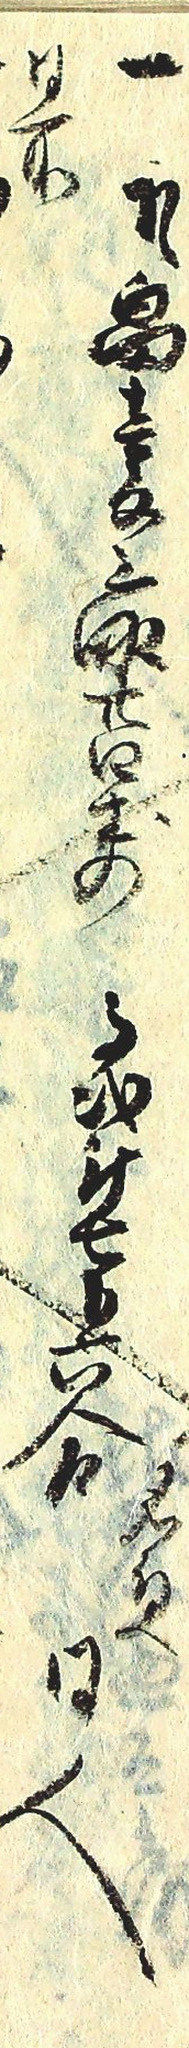一下々畠壱反三畝廿四歩高弐斗七升六合同人
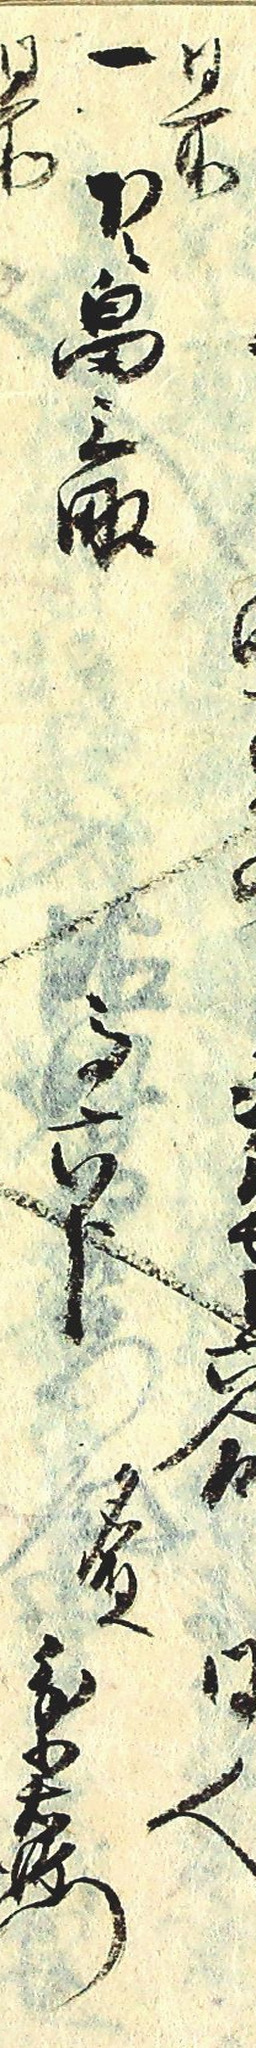一下々畠三畝高六升分五右衛門
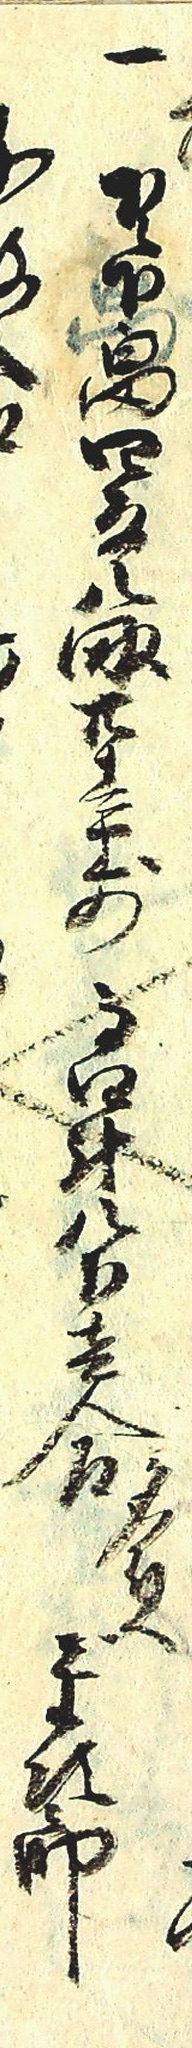一下々下畠四反八畝廿壱歩高四斗八升壱合重次郎
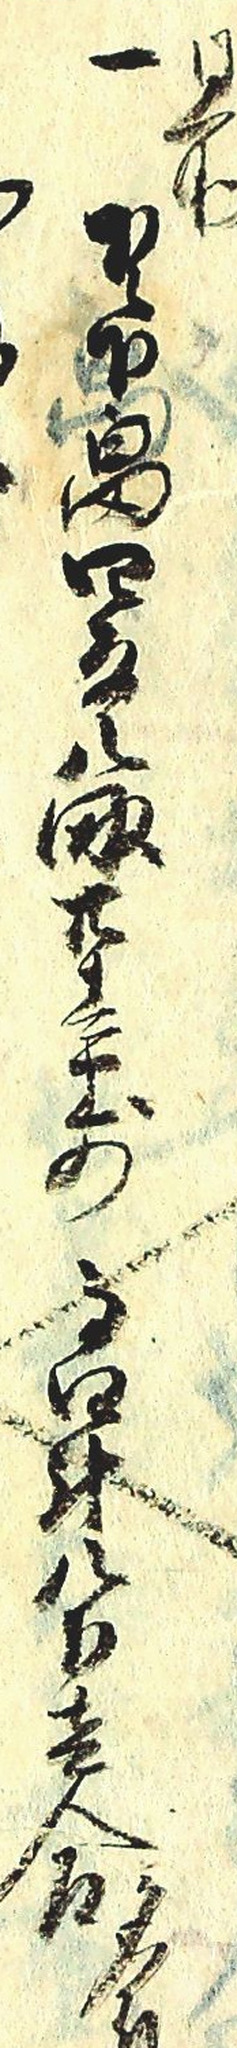一下々下畠四反八畝廿壱歩高四斗八升壱合重次郎
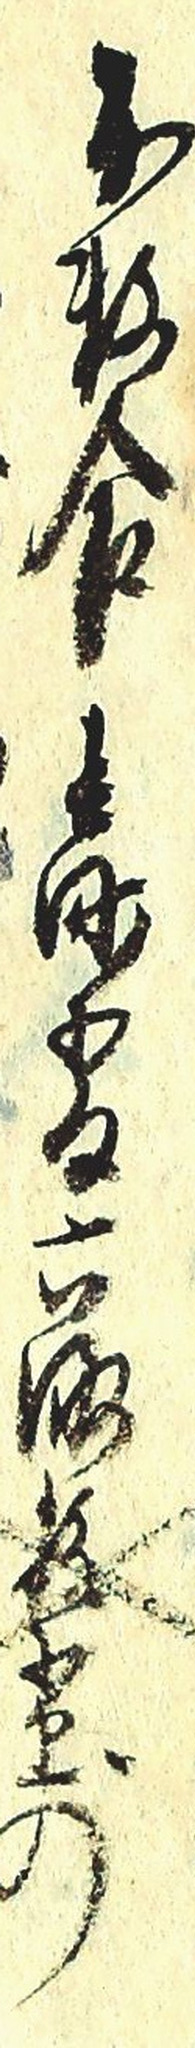反数合壱町五反六畝拾五歩
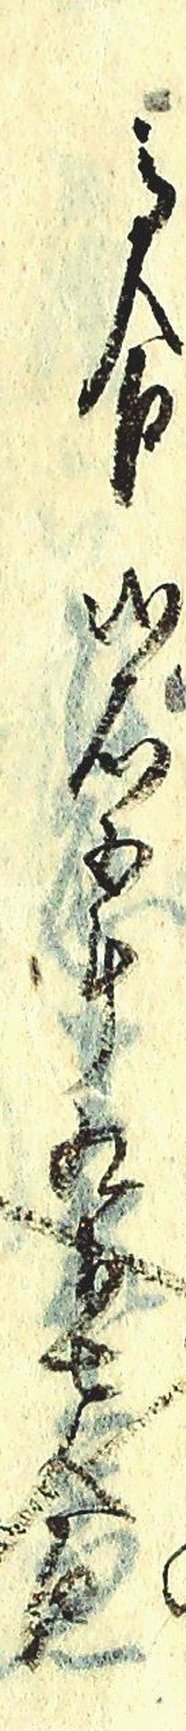高合弐石五斗九升七合
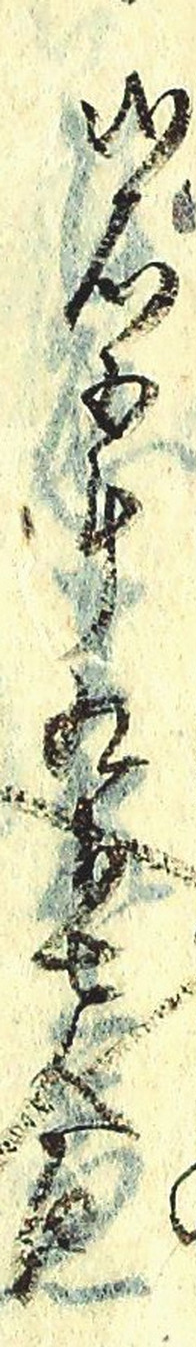高合弐石五斗九升七合
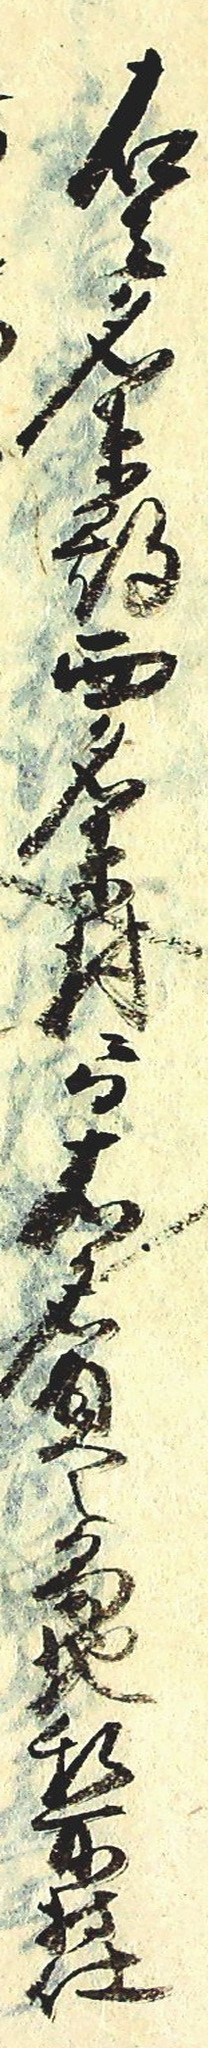右は名東郡西名東村にて右名負之畠地私所持仕
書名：諸御願書控(弐番）
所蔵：鳴門教育大学 Naruto University of Education
